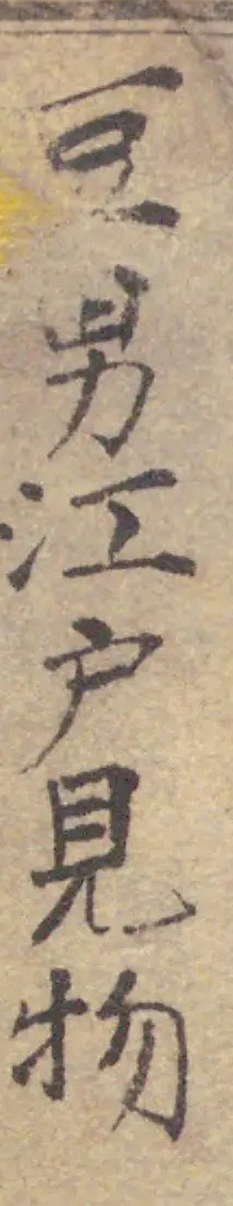豆男江戸見物完
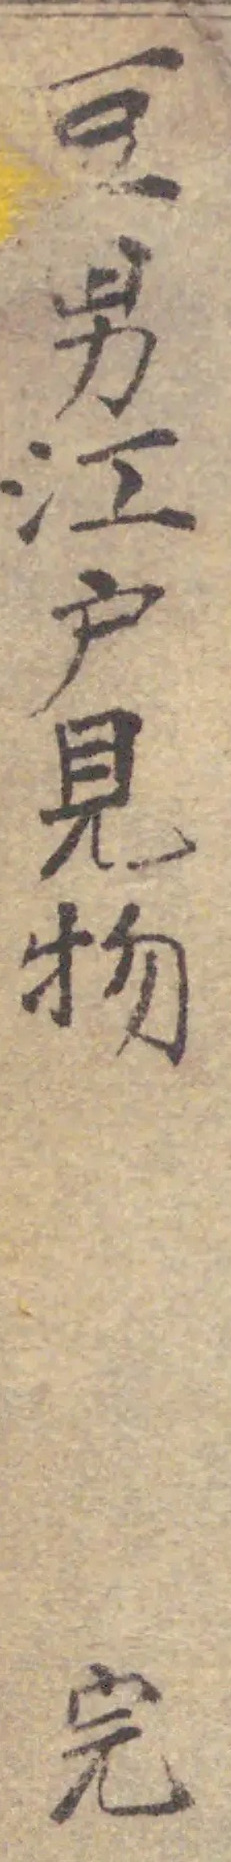豆男江戸見物完

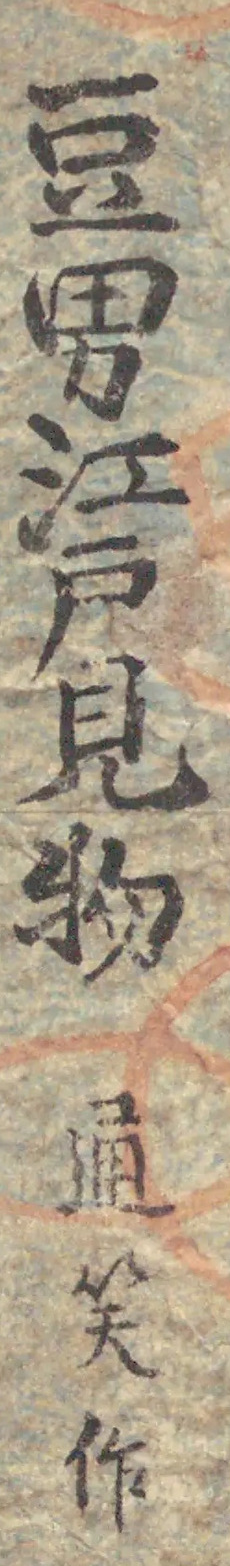豆男江戸見物通笑作

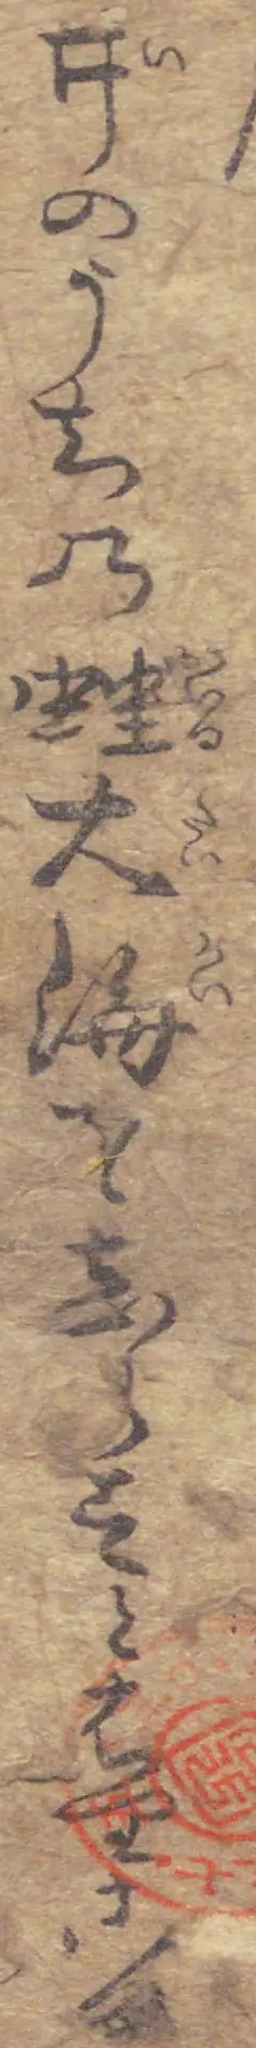井のうちの蛙大海をしらすとはりこま
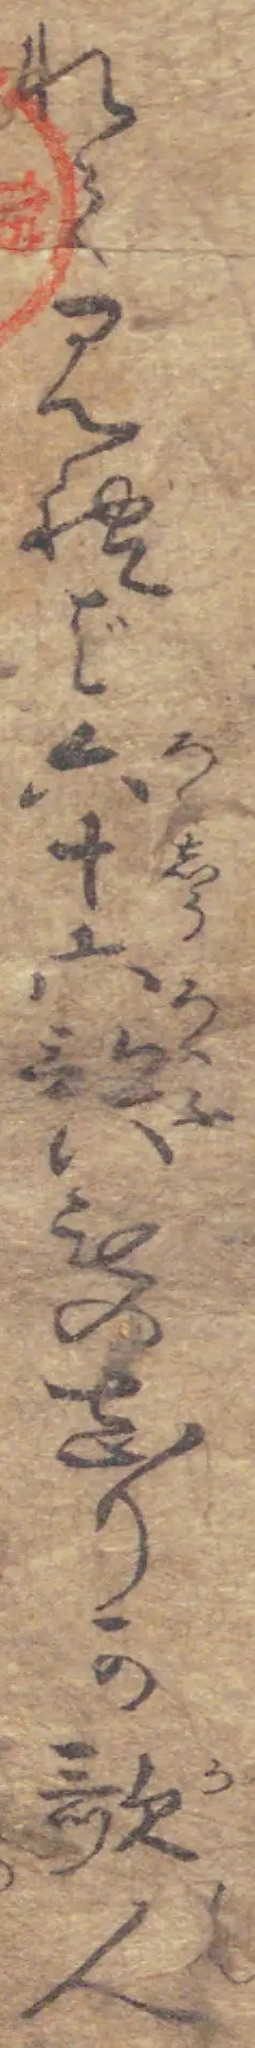れてみれば六十六部ハものしりか歌人
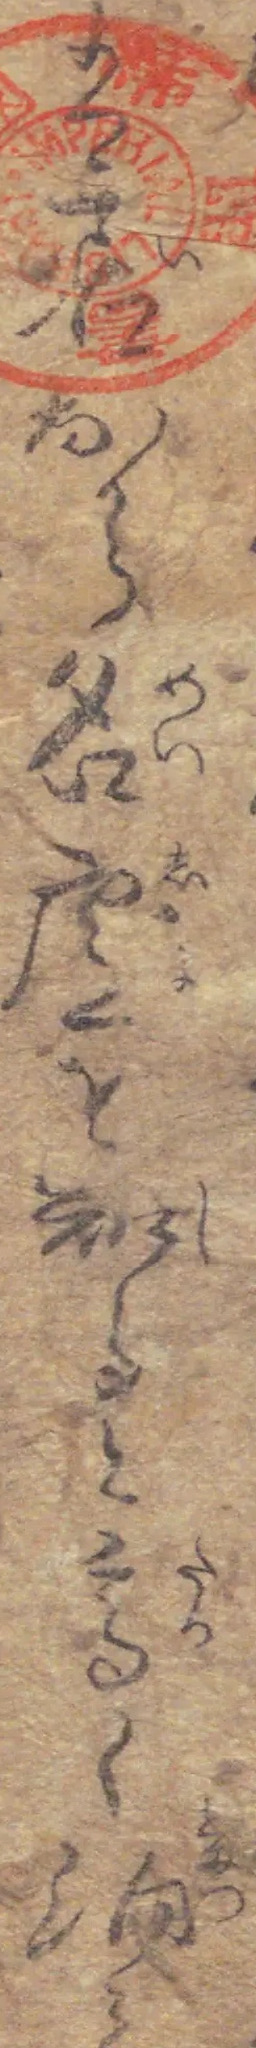有居なから名處を知ると高く泊て
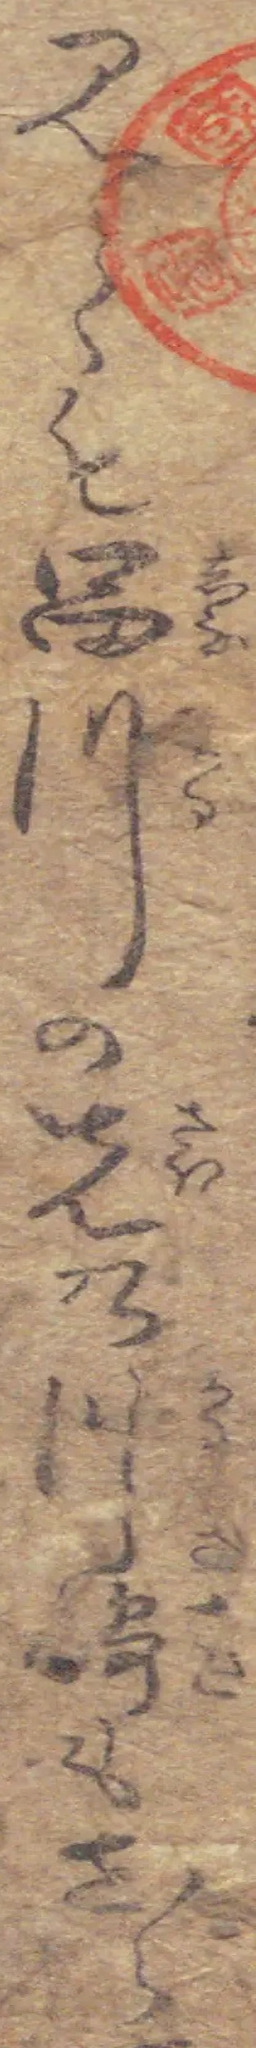みても品川の先の川崎もしらす
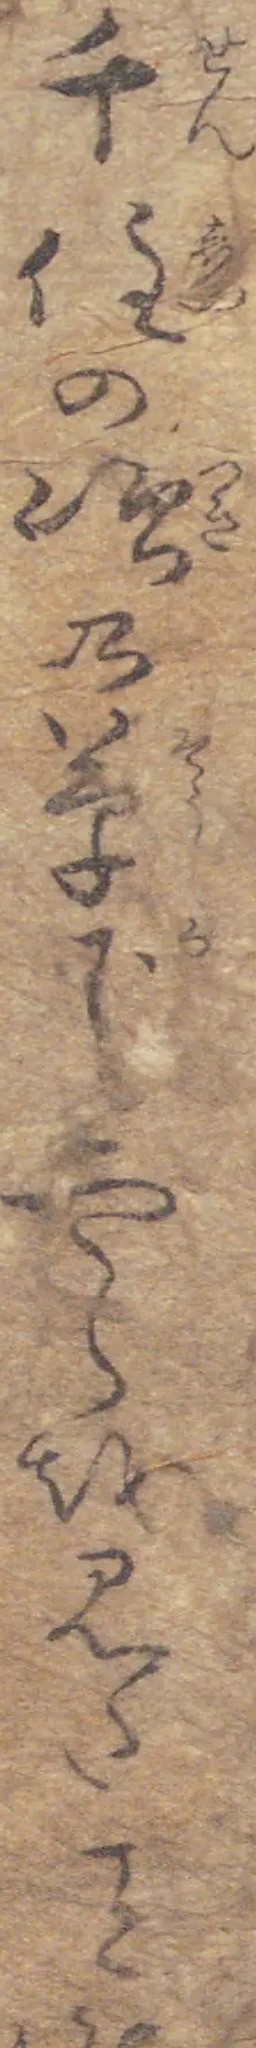千住の次の草下やらをみたことも
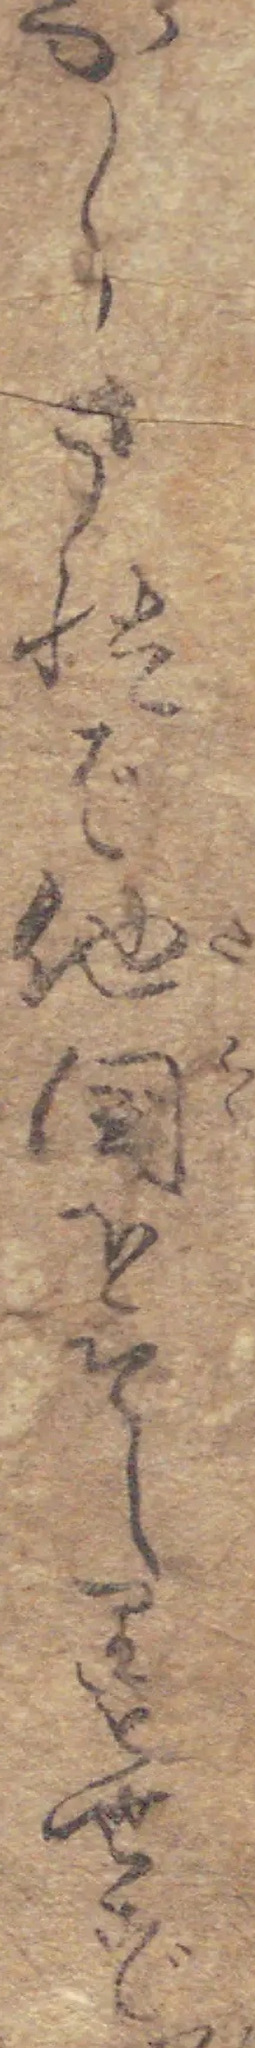なしされば他国をもしりもせず隙
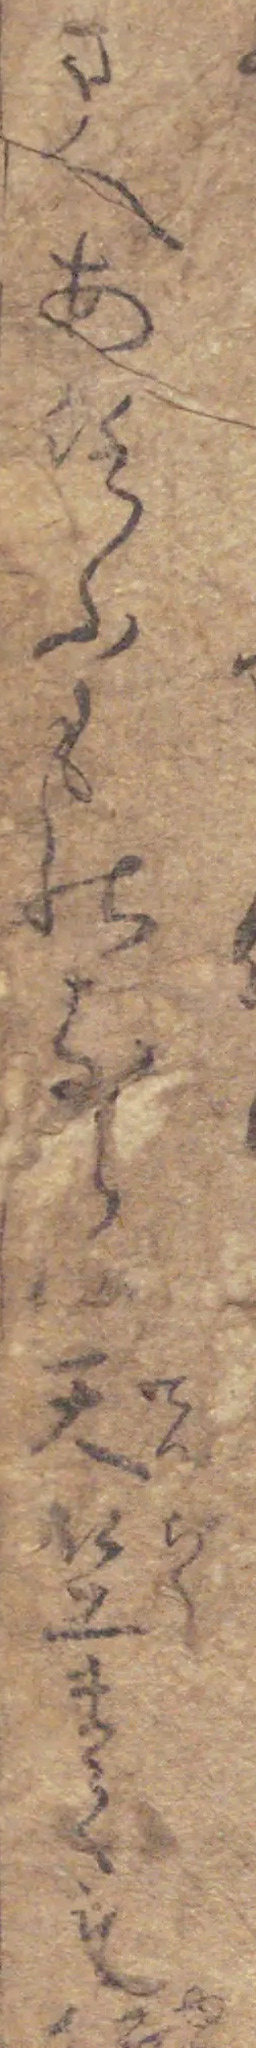さへあろふものなら天竺まても行

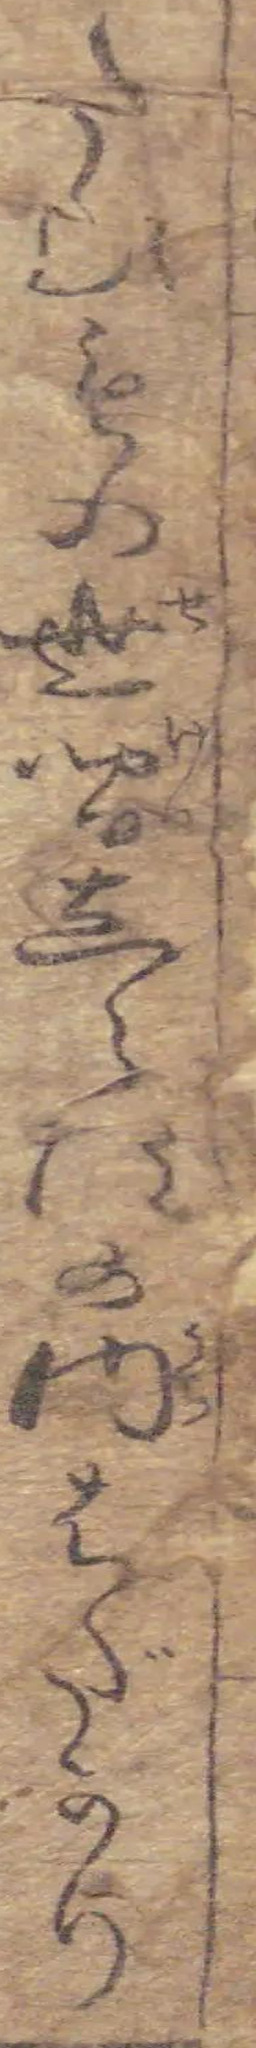たひもの世間しらすの内はだかと
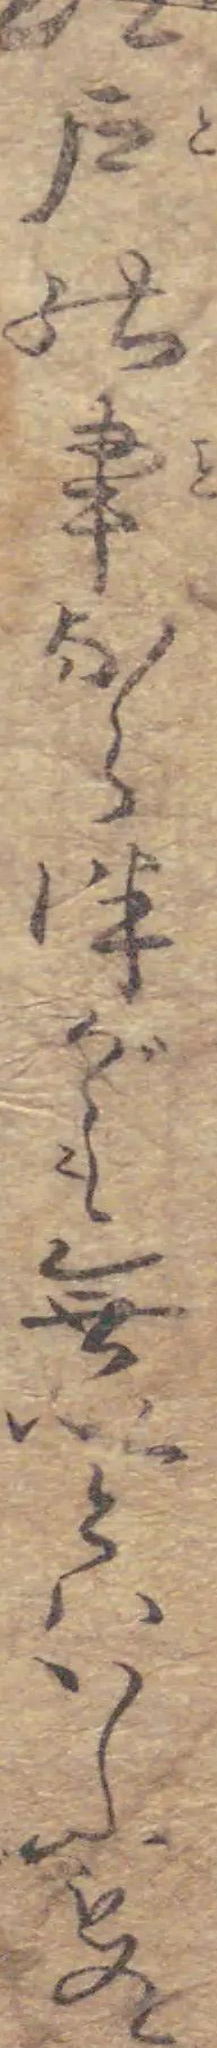江戸の事ならつがも無いとハいふものゝ
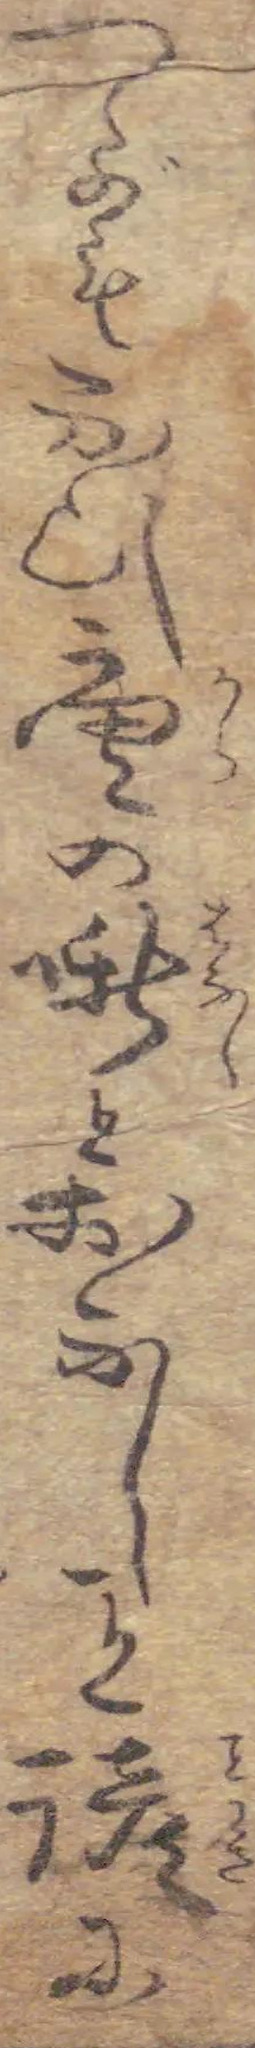つがもなひ唐の噺とおなしこと諺に
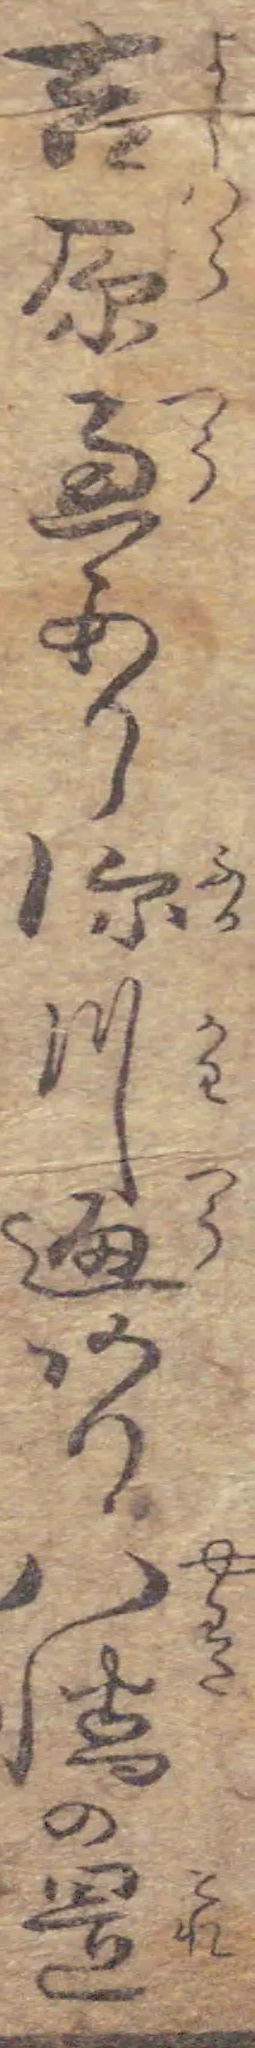吉原通あり深川通あり八幡の是
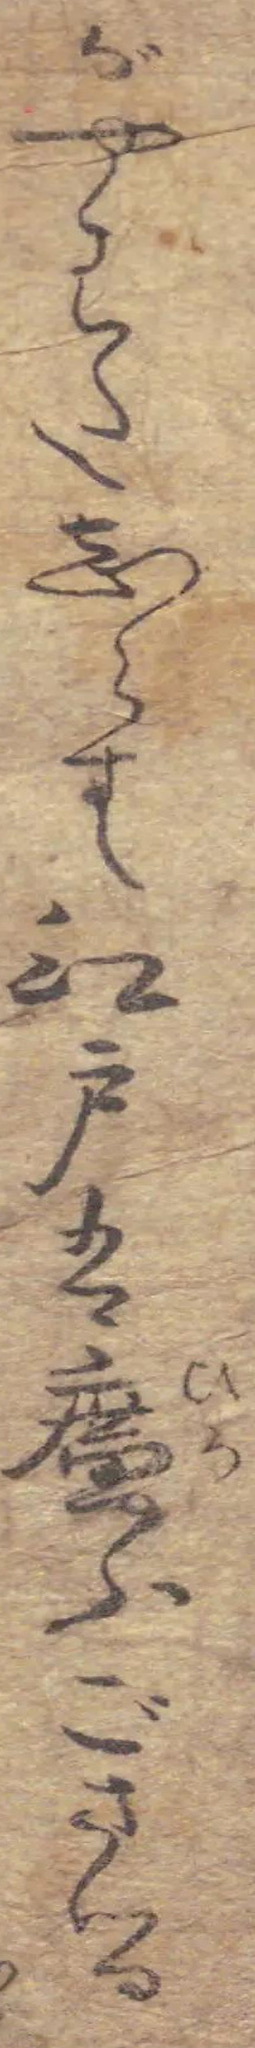がやわたしらす江戸は廣ふごさる
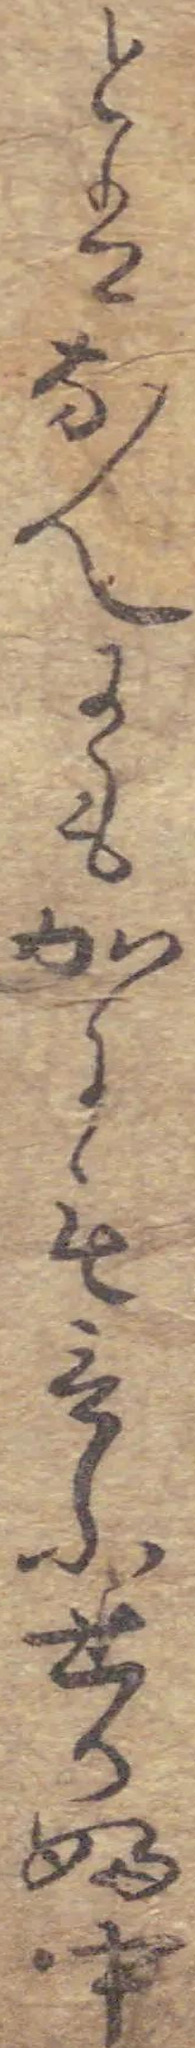とはなんにもかにも言ふせりふ中
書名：豆男江戸見物 2巻
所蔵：国立国会図書館 National Diet Library, JAPAN
